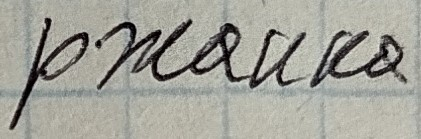ржанка
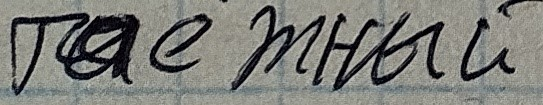таежный
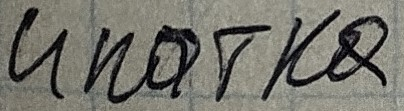ипатка
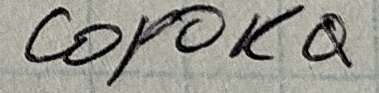сорока
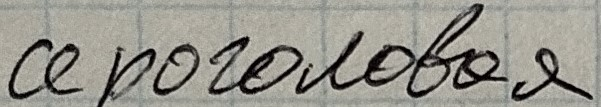сероголовая
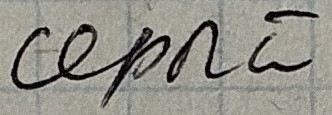серый
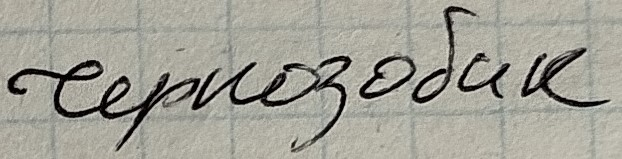чернозобик
